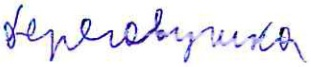береговушка
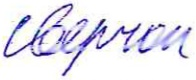сверчок
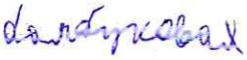бамбуковая
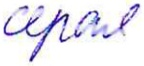серая
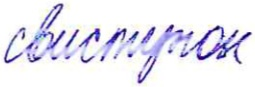свистунок
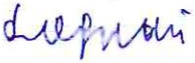бледный
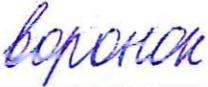воронок
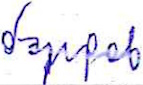бэрдов
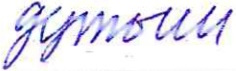дутыш
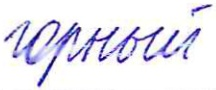горный
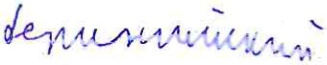берингийский
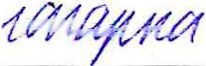гагарка
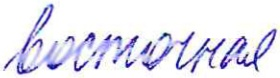восточная
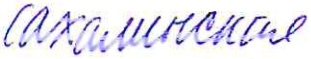сахалинская
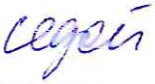седой
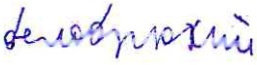белобрюхий
